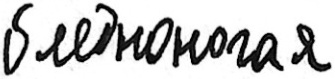бледноногая
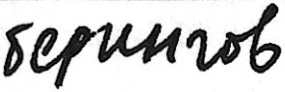берингов
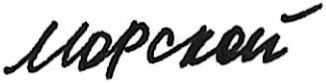морской
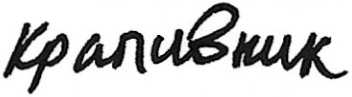крапивник
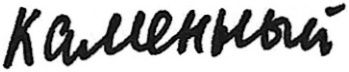каменный
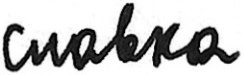славка
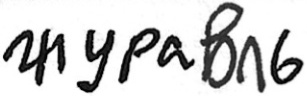журавль
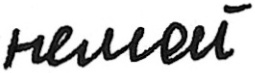немой
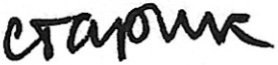старик
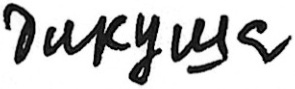дикуша
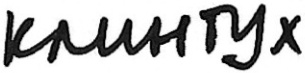клинтух
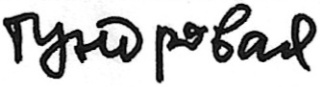тундровая
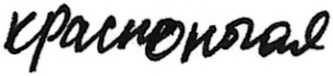красноныая
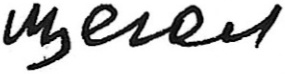щегол
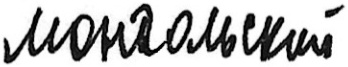монгольский
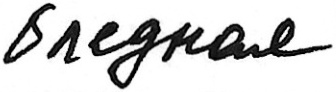бледная
